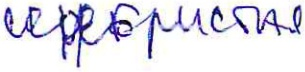серебристая
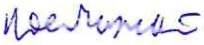посматий
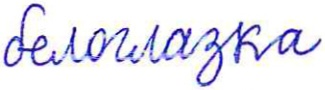белоглазка
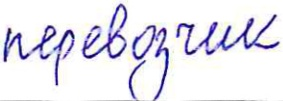перевозчик
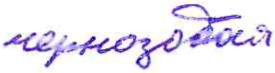чернозобая
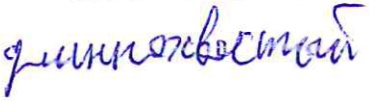длиннохвостый
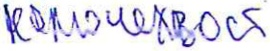колючехвост
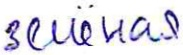зелёная
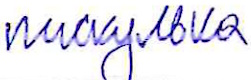пискулька
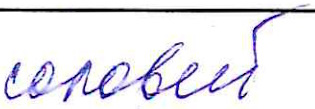соловей
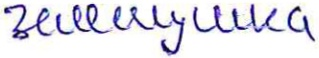зеленушка
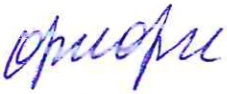фифи
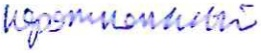короткопалый
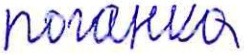поганка
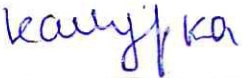калурка
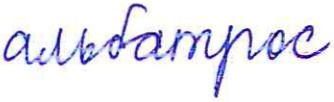альбатрос
